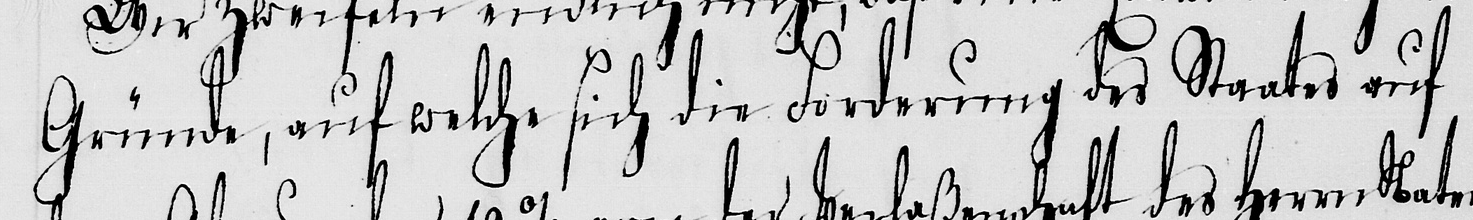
Gründe, auf welche sich die Forderung des Staates auf
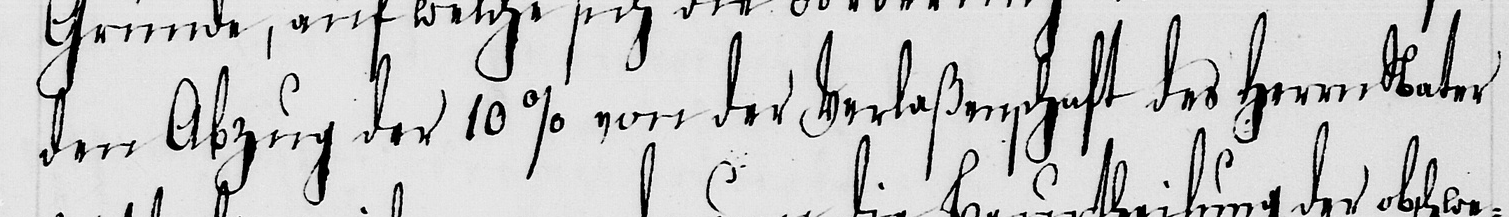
den Abzug der 10 % von der Verlaßenschaft des Herrn Nater
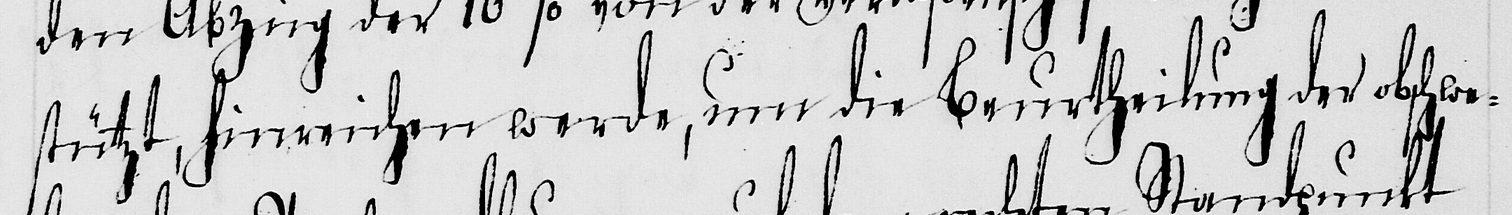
stützt, hinreichen werde, um die Beurtheilung der obschw¬
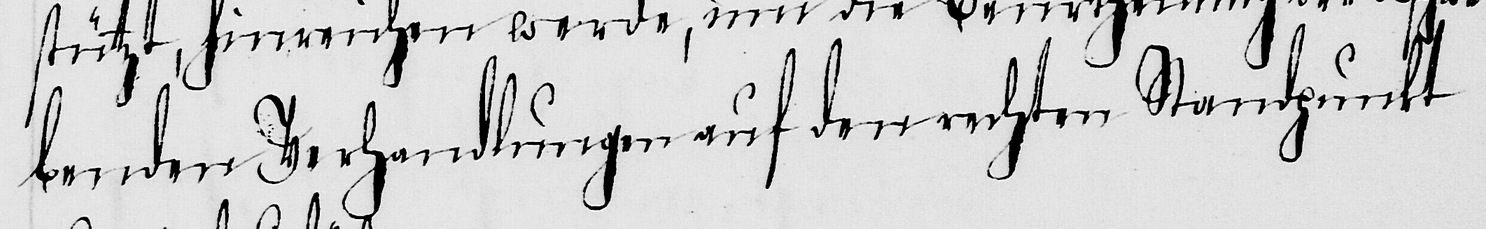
ebenden Verhandlungen auf den rechten Standpunkt
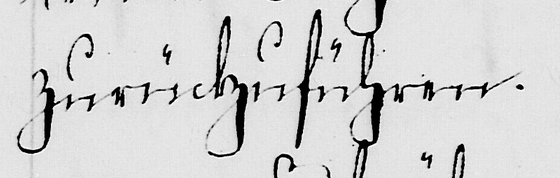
zurückzuführen.
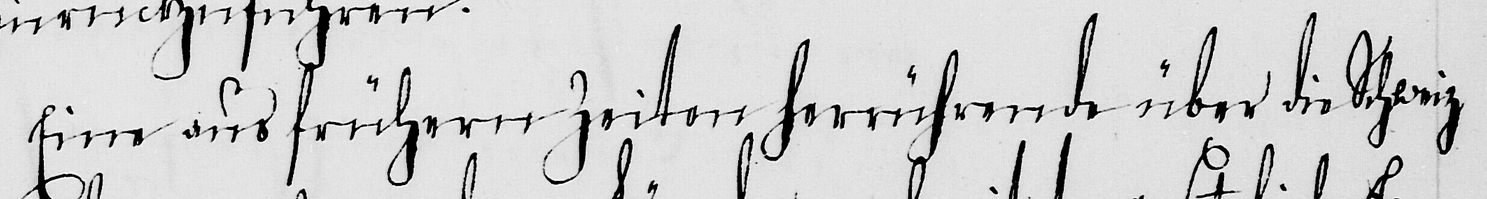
Eine aus frühern Zeiten herrückende über die Schweiz
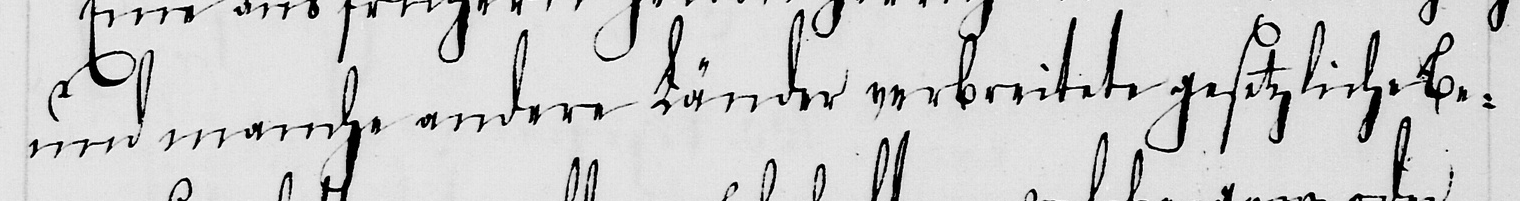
und manche andere Länder verbreitete gesetzliche Be¬
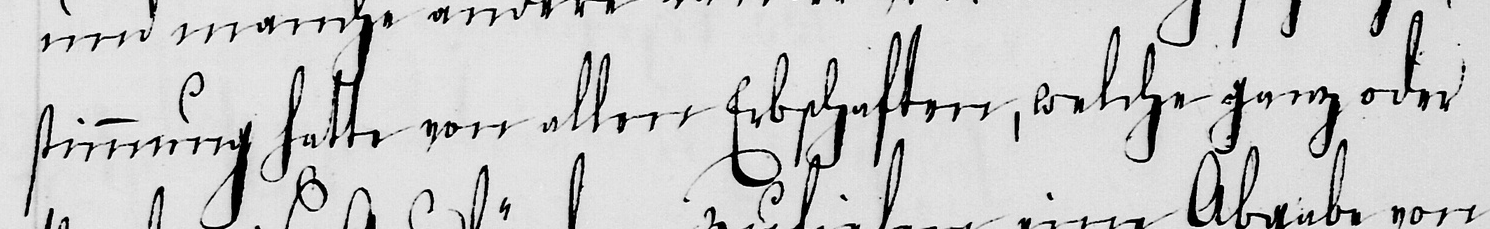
stimmung hatte von allen Erbschaften, welche ganz oder
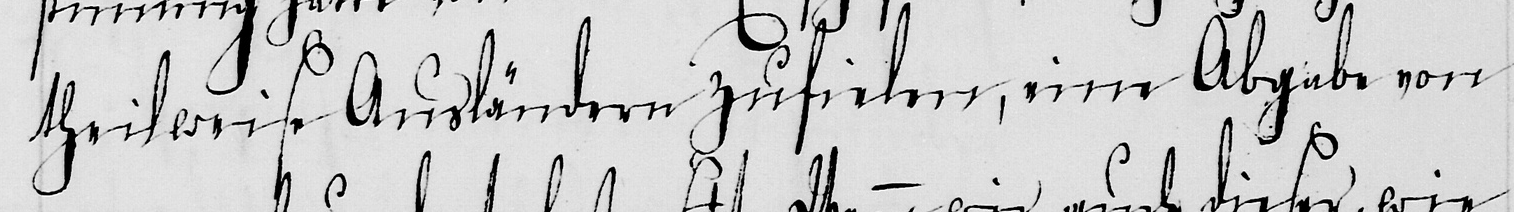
theilweise Ausländern zufielen, eine Abgabe von
